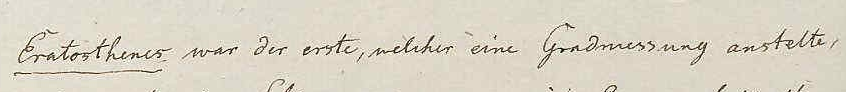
Eratosthenes war der erste, welcher eine Gradmessung anstelte,
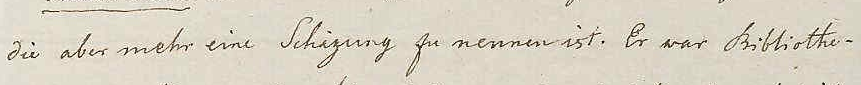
die aber mehr eine Schäzung zu nennen ist. Er war Bibliothe-
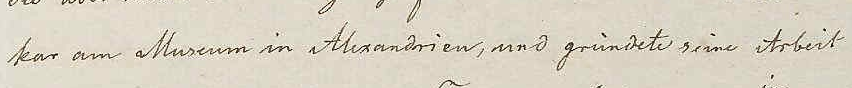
kar am Museum in Alexandrien, und gründete seine Arbeit
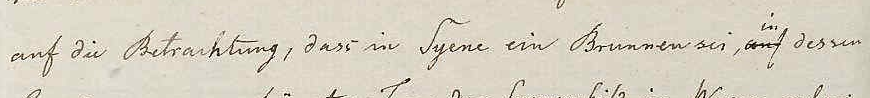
auf die Betrachtung, dass in Syene ein Brunnen sei, aufin dessen
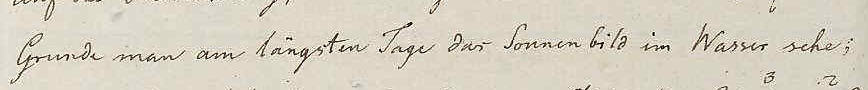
Grunde man am längsten Tage das Sonnenbild im Wasser sehe;
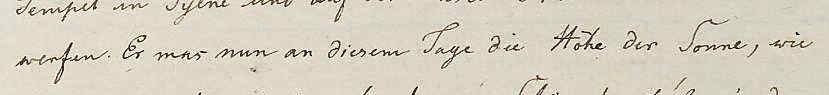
werfen. Er mas nun an diesem Tage die Höhe der Sonne, wie
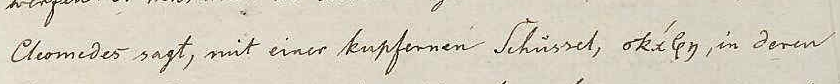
Cleomedes sagt, mit einer kupfernen Schüssel, σκάφη, in deren
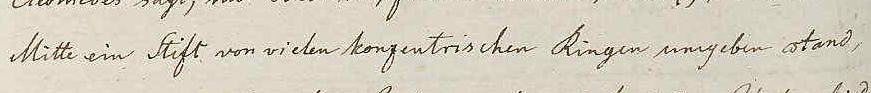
Mitte ein Stift von vielen konzentrischen Ringen umgeben stand,
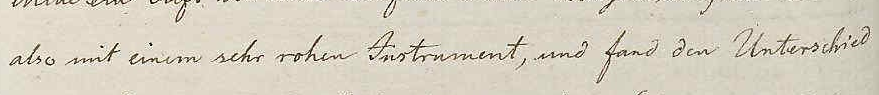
also mit einem sehr rohen Instrument, und fand den Unterschied
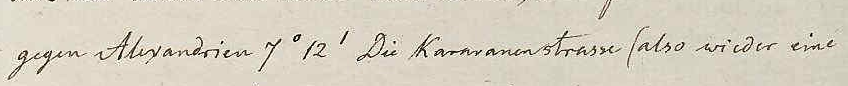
gegen Alexandrien 7° 12′ Die Karavanenstrasse gab ihm für die
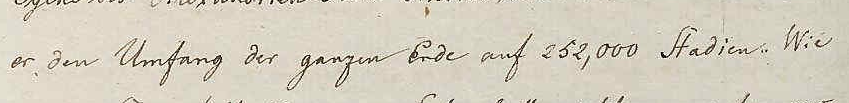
er den Umfang der ganzen Erde auf 252,000 Stadien. Wie
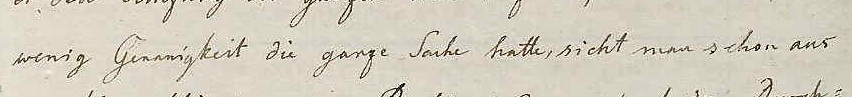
wenig Genauigkeit die ganze Sache hatte, sieht man schon aus
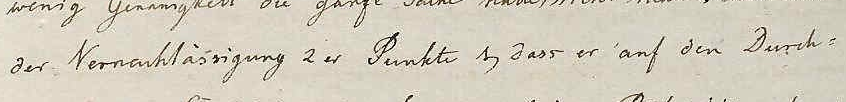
der Vernachlässigung 2er Punkte 1, dass er auf den Durch-
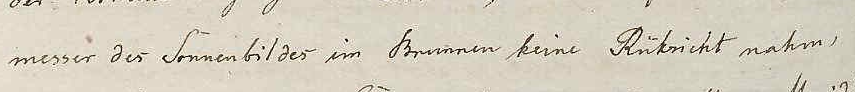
messer des Sonnenbildes im Brunnen keine Rüksicht nahm,
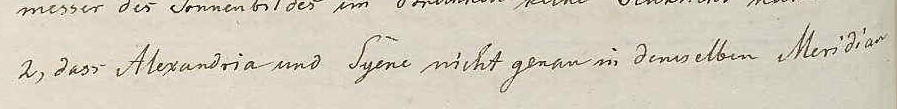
2, dass Alexandria und Syene nicht genau in demselben Meridian
